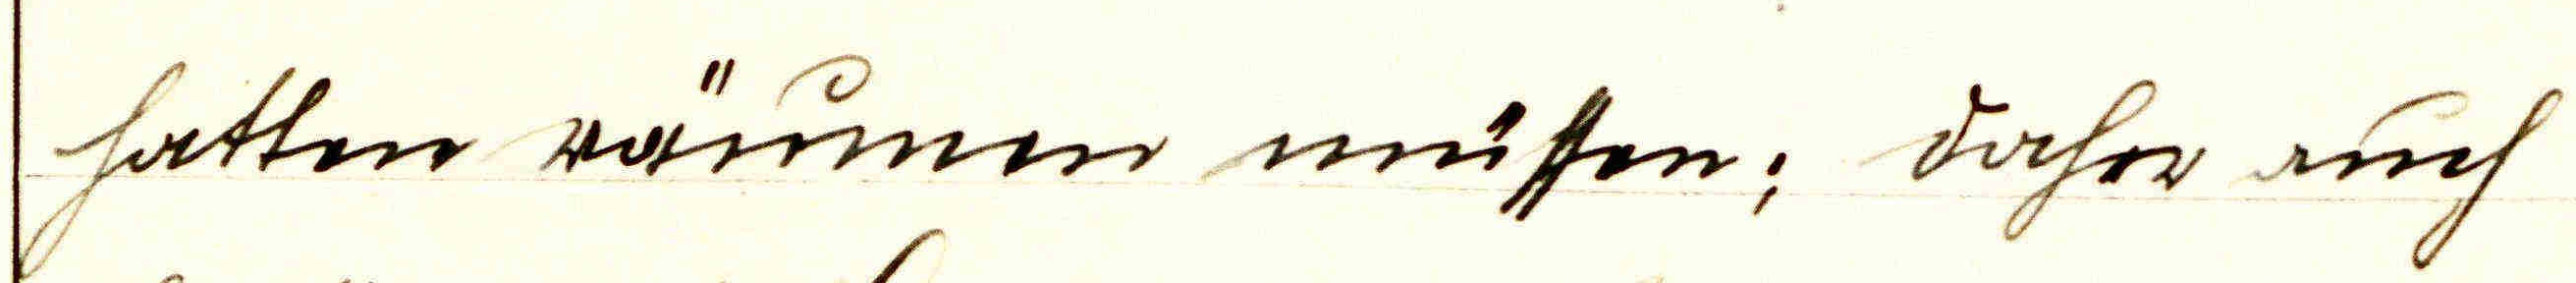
hatten räumen müssen; daher auch
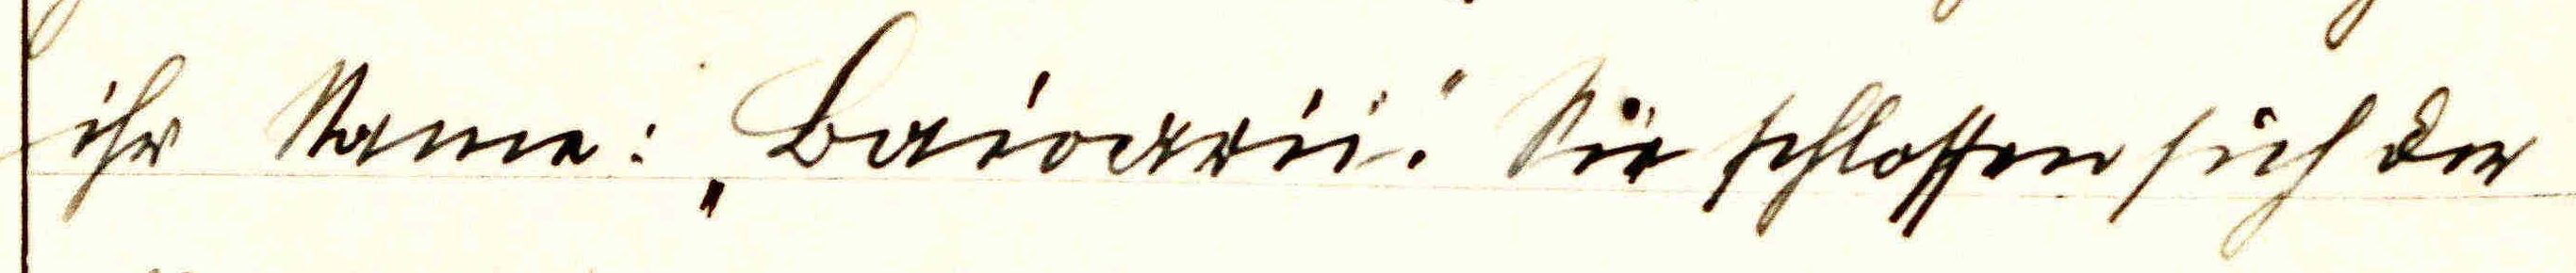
ihr Name:“ Baioarii“ Sie schlossen sich der
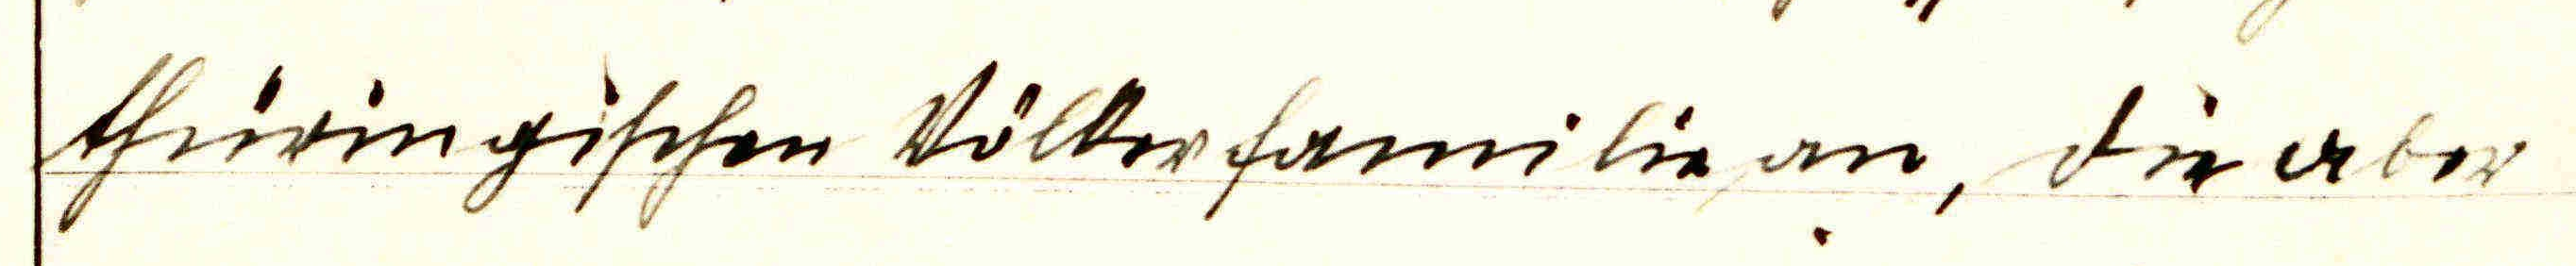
thüringischen Völkerfamilie an, die aber
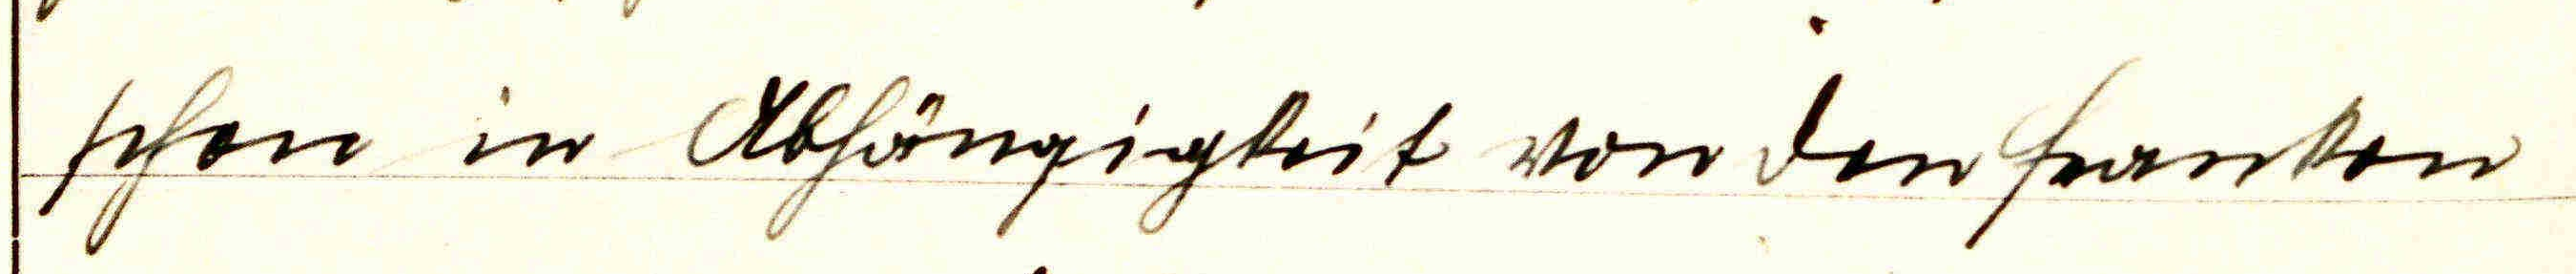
schon in Abhängigkeit von den Franken
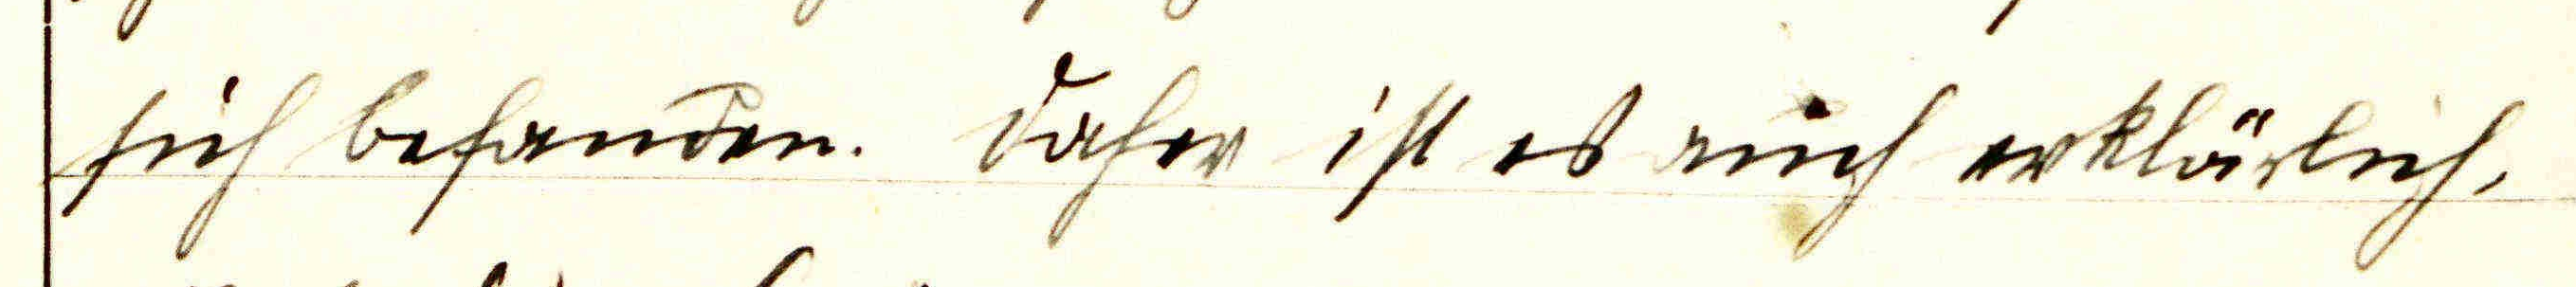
sich befanden. Daher ist es auch erklärlich,
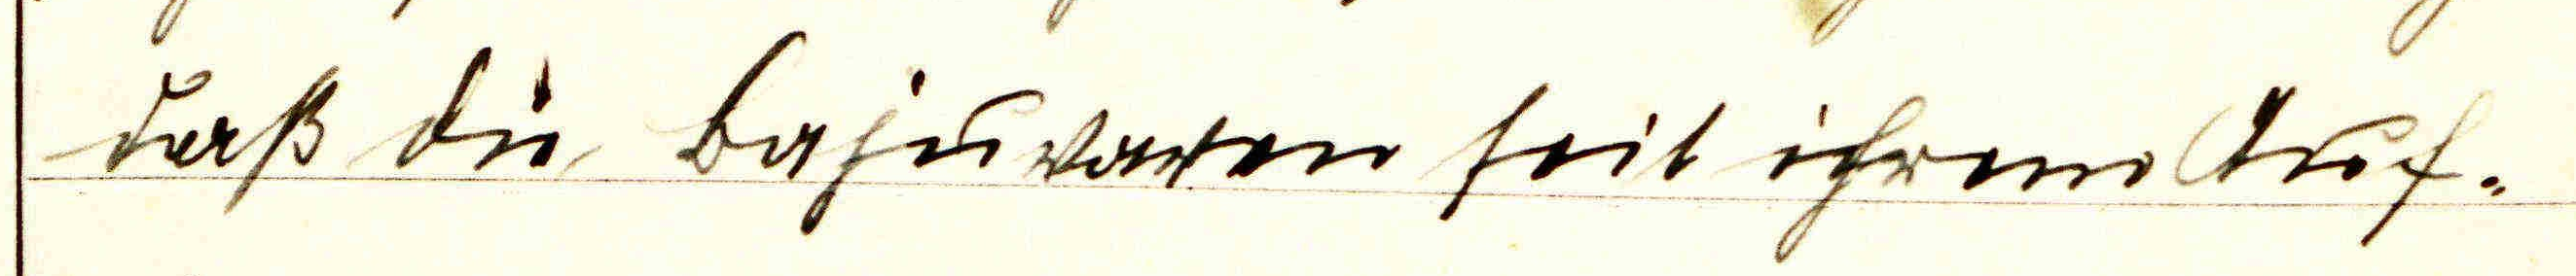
daß die Bajuwaren seit ihrem Auf-
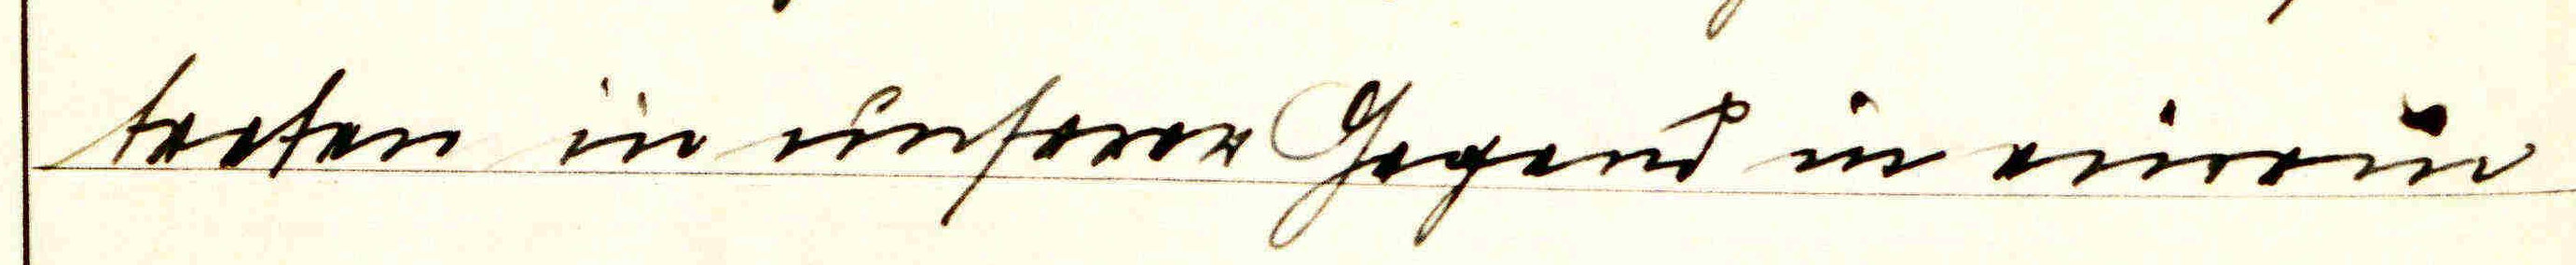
treten in unserer Gegend in einem
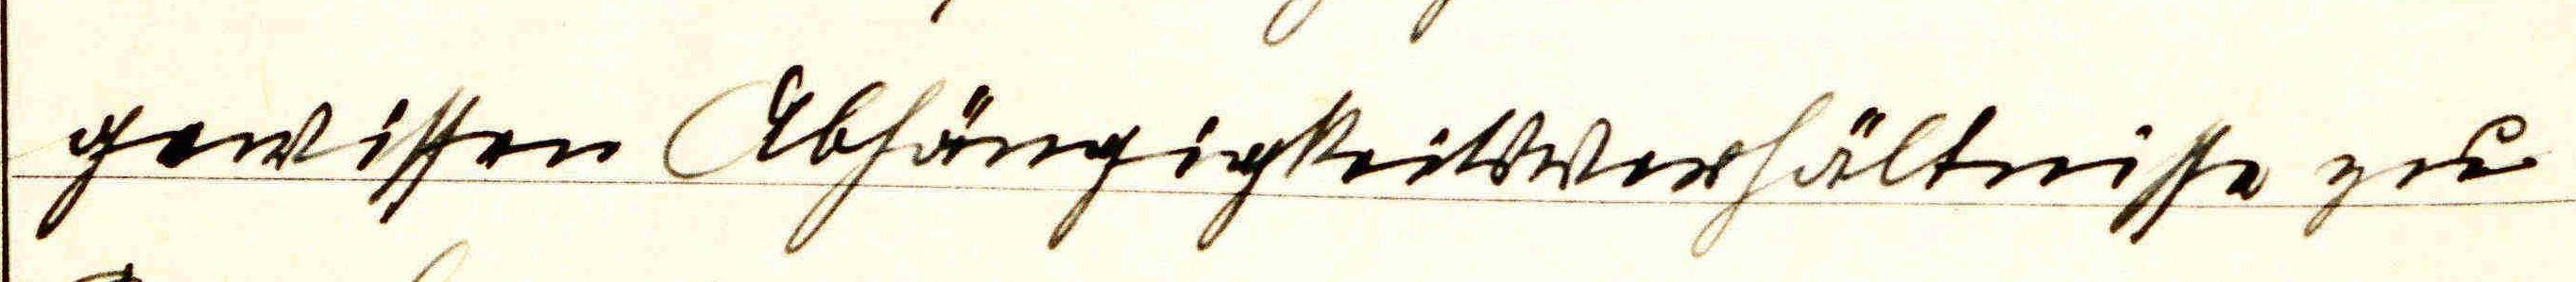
gewissen Abhängigkeitsverhältnisse zu
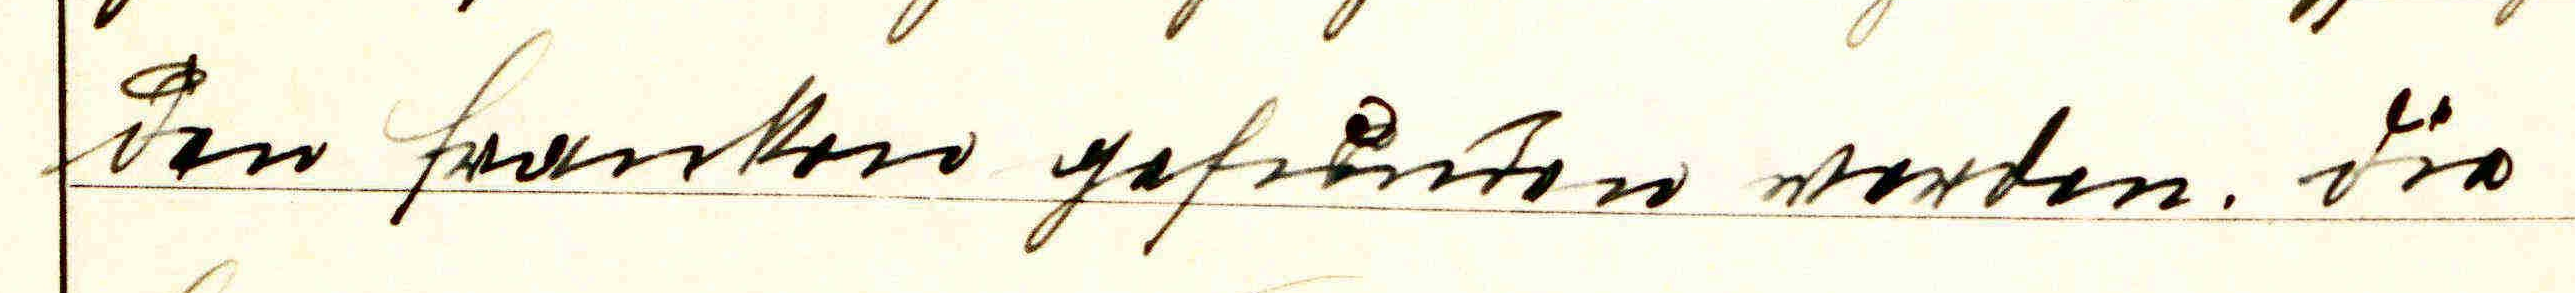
den Franken gefunden werden. Die
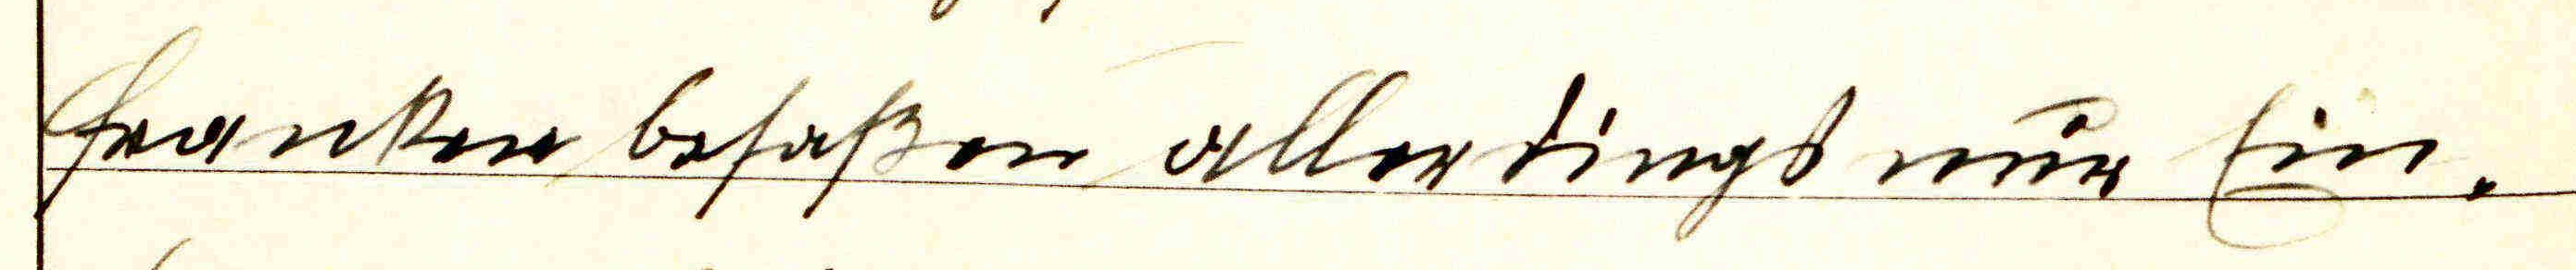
Franken besaßen allerdings nur Ein-
